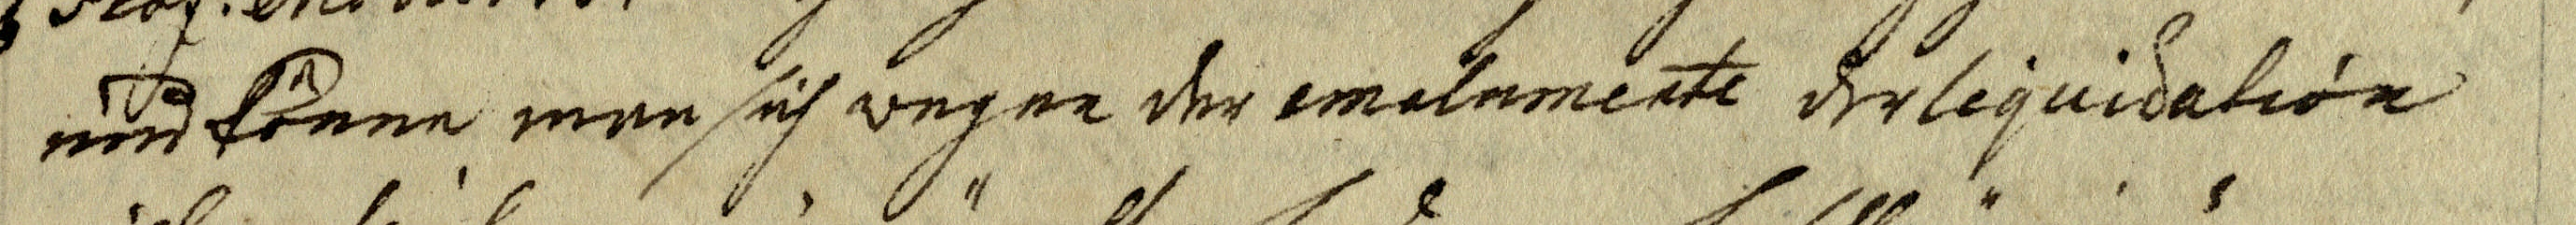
und könne man sich wegen der emolumente der liquidation
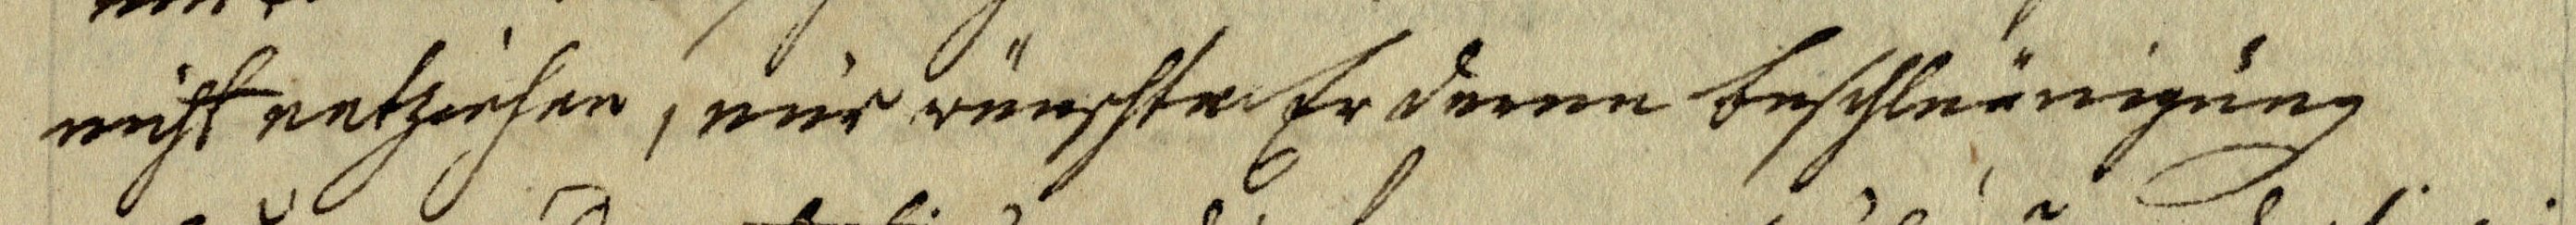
nicht entziehen, nur wünschte Er deren Beschleunigung
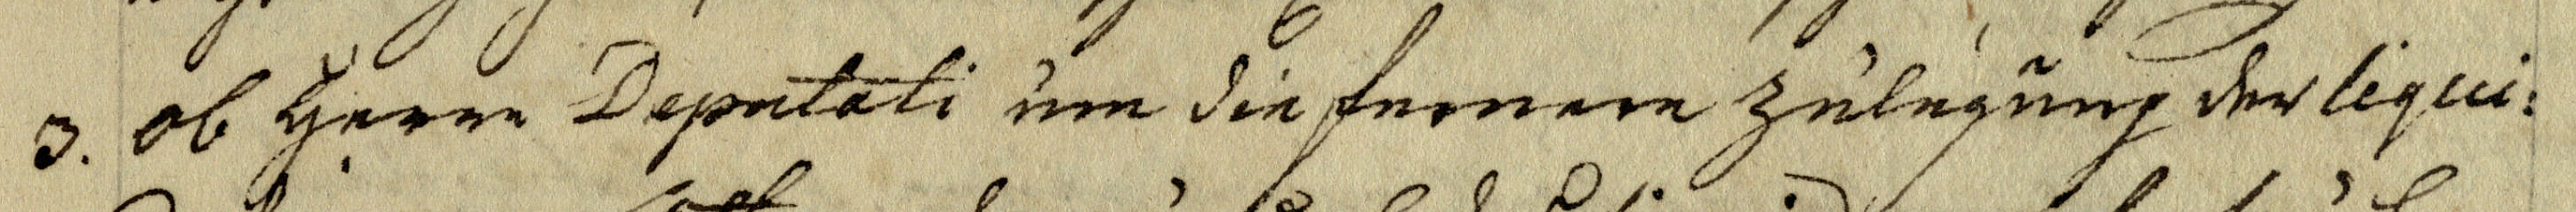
3. ob Herrn Deputati um die fernere Zulegung der liqui¬
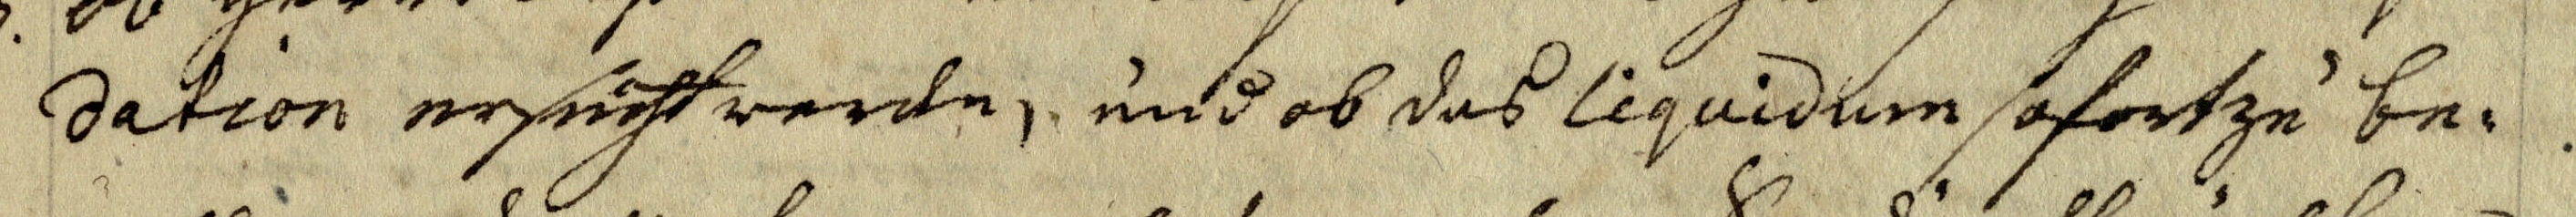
dation ersucht werden, und ob das liquidum sofort zu be¬
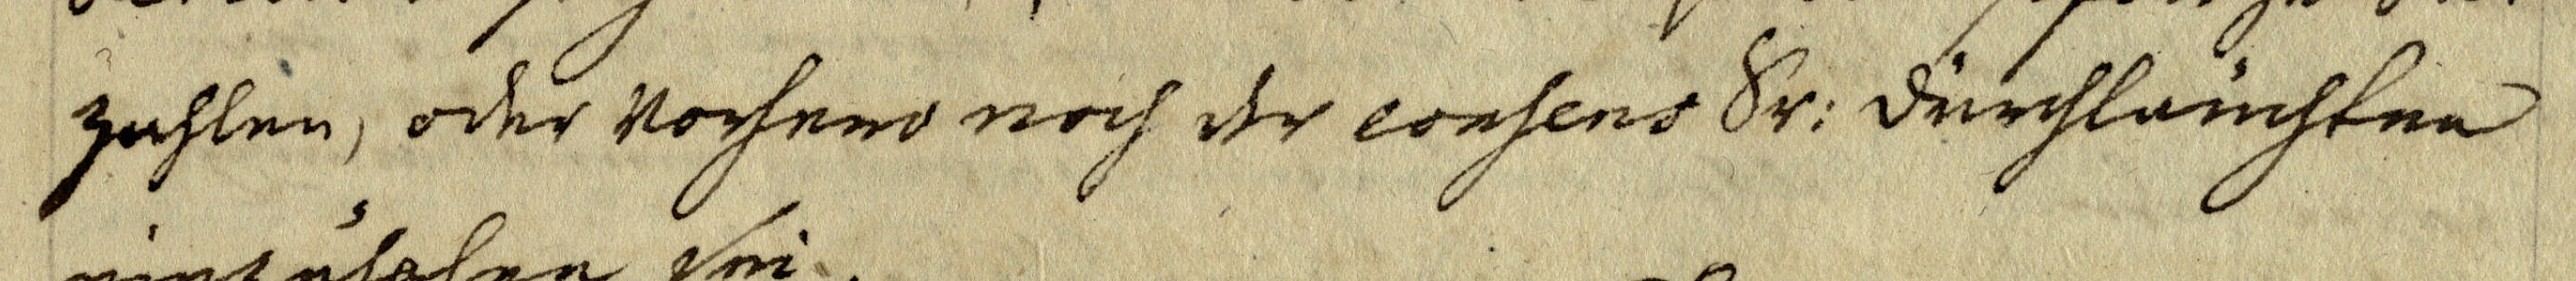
zahlen, oder vorhero noch der consens Sr Durchlauchten
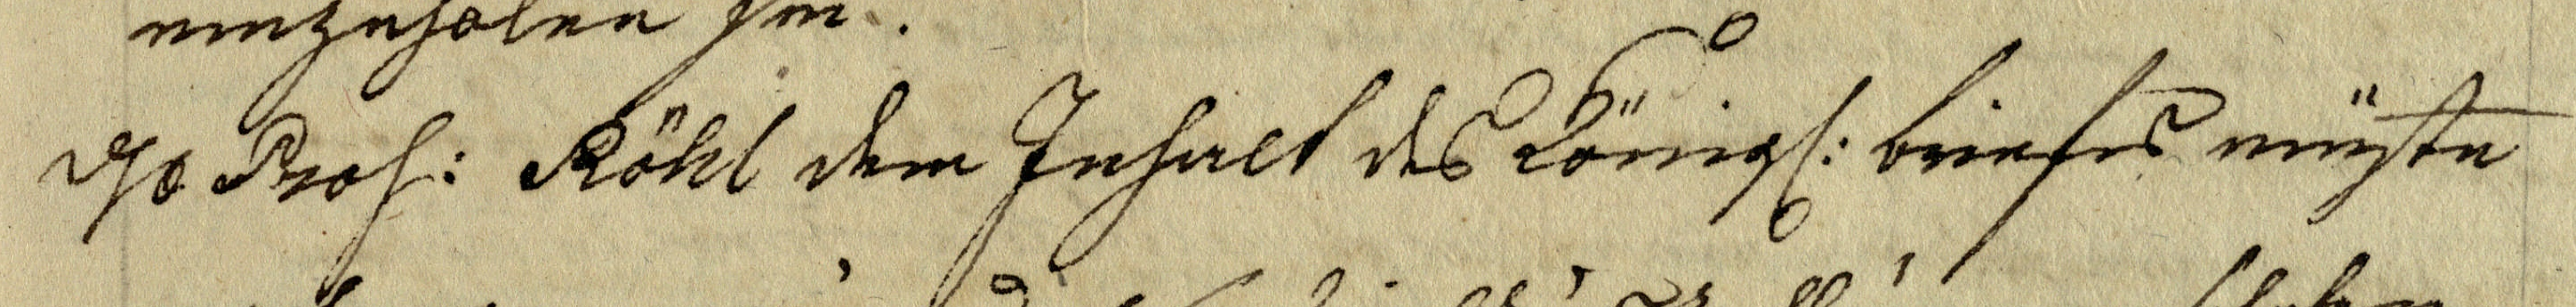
einzuholen sei.
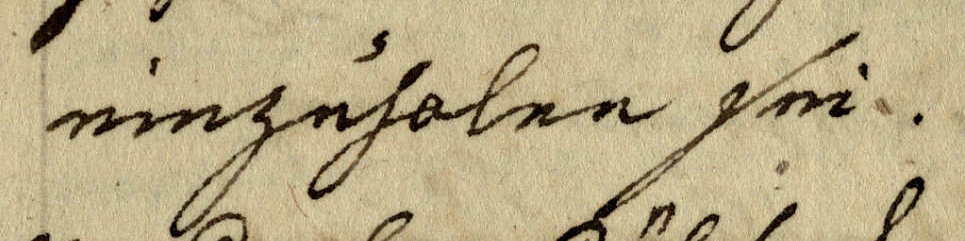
dh Prof. Röhl dem Inhalt des Königl. Briefes müßte
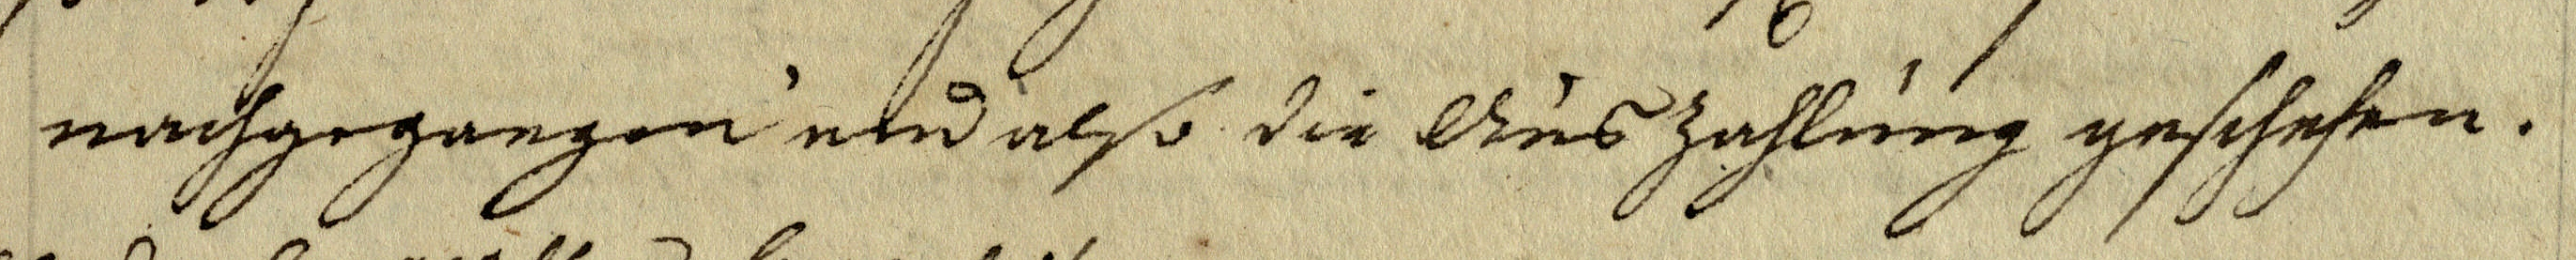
nachgegangen und also die Auszahlung geschehen.
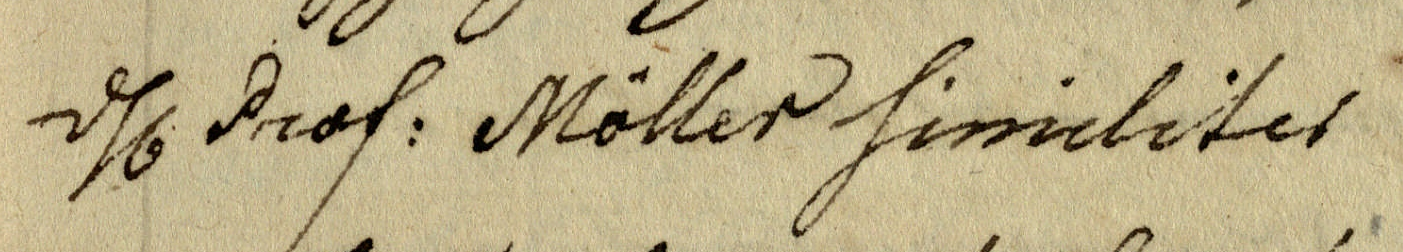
dh Prof. Möller similiter
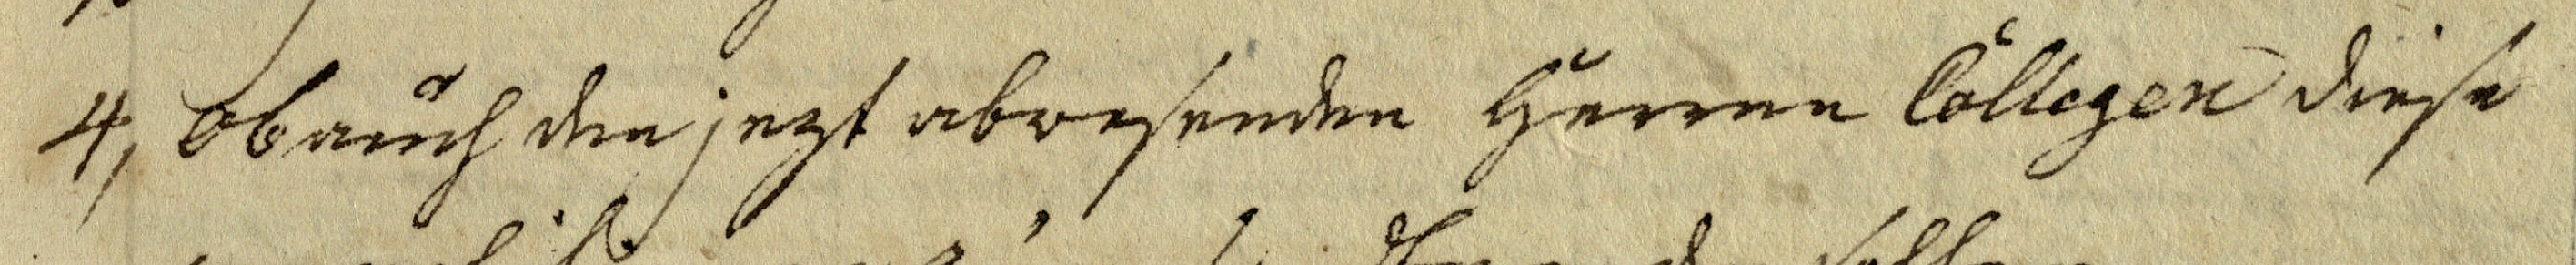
4. ob auch dem jezt abwesenden Herren Collegen diese
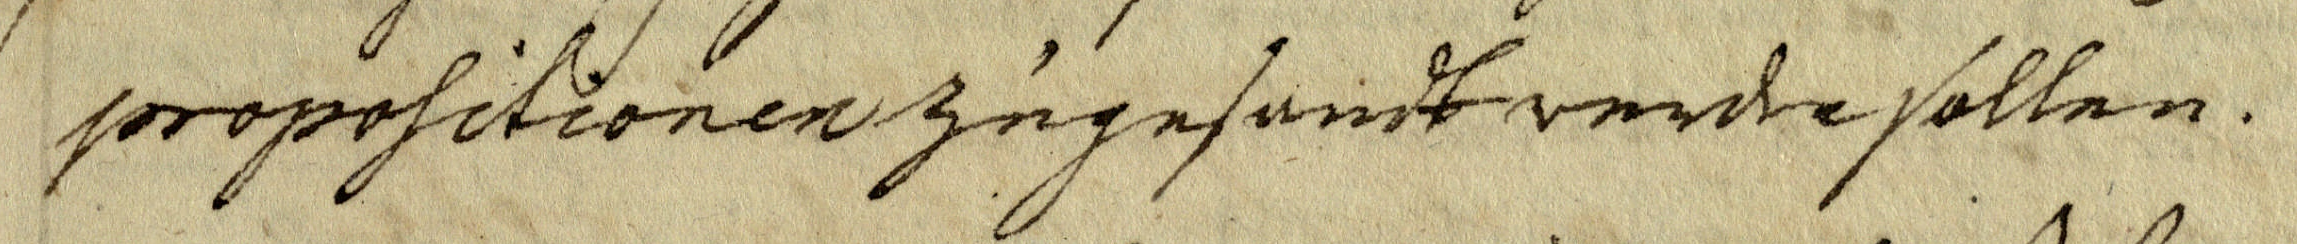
propositionen zugesandt werden sollen.
